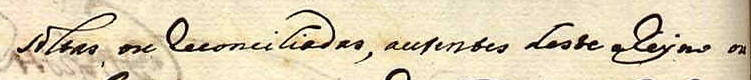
soltas, ou Reconciliadas, ausentes deste Reyno ou
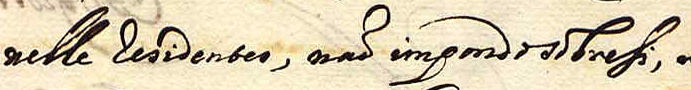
nelle Residentes, naõ impondo sobre si, nem
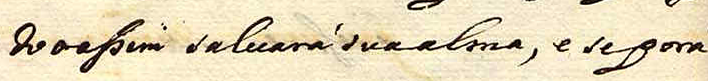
do o assim saluará sua alma, e se porá em
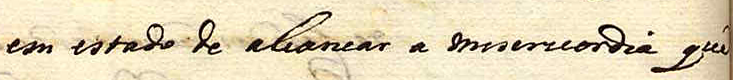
em estado de alcancar a misericordia que
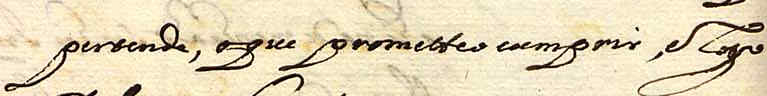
pertende, o que prometteo cumprir, e logo
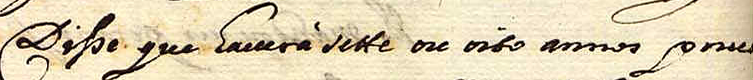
Disse que hauerá sette ou oito annos pouco
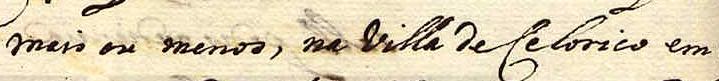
mais ou menos, na Villa de Celorico em Ca
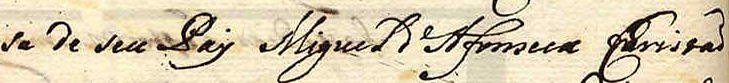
sa de seu Pay Miguel de Afonseca Christaõ
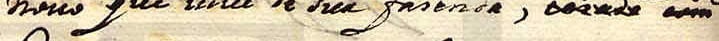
nouo que uiue de sua fasenda, _
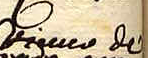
Viuuo de
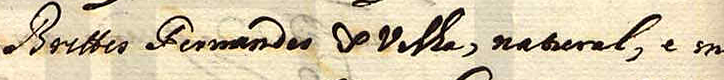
Brittes Fernandes X Velha, natural, e mo
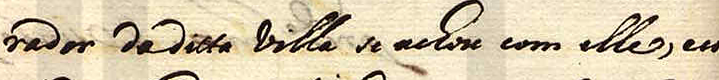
rador da ditta villa se achou com elle, e com
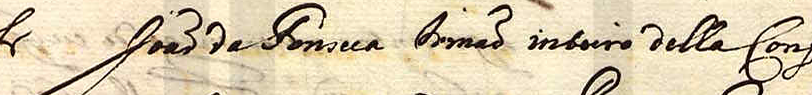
Joaõ da Fonseca Irmaõ inteiro della Confiten
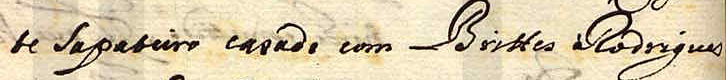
te sapateiro casado com Brittes Rodrigues
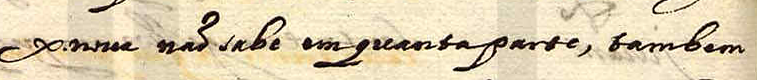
x. noua naõ sabe em quanta parte, tambem
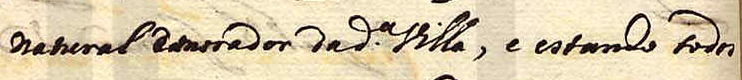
natural E morador da d.a villa, e estando todos
